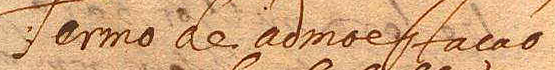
Termo de admoestaçaõ
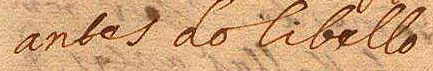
antes do libello
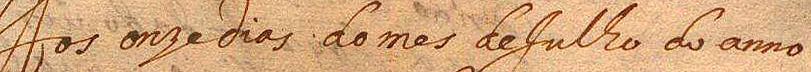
Aos onze dias do mes de Julho do anno
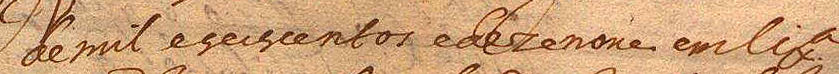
de mil e seiscentos e dezenoue em lix.a
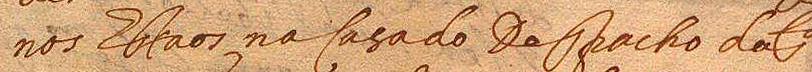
nos Estaos na Casa do Despacho da sta
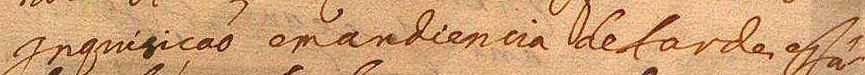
Jnquisição em audiencia de tarde estā
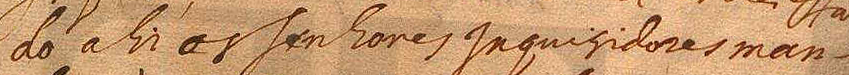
do ahi os senhores Jnquisidores man
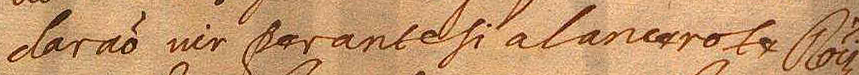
daraõ uir perante si a Lancerote Roīz
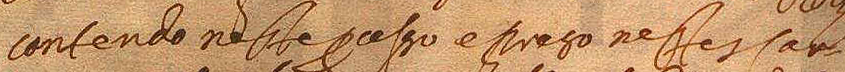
conteudo neste ꝓcesso e preso nestes Car
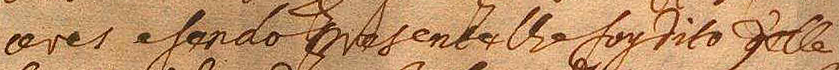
ceres e sendo presente lhe foy dito q̄ elle
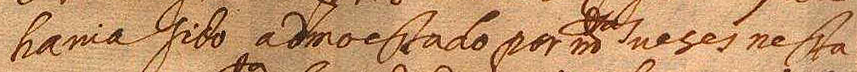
hauia sido admoestado por mtas ueses nesta
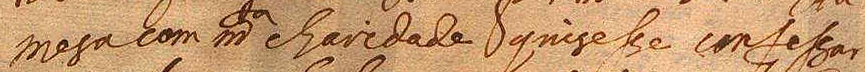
mesa com mta charidade quisesse confessar
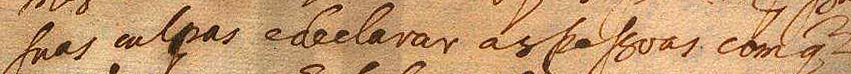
suas culpas e declarar as pessoas com q̄
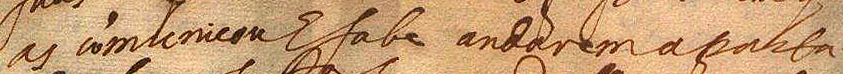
as cōmunicou E sabe andarem aparta
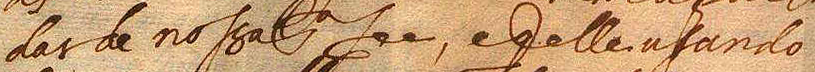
das de nossa sta fee, e q̄ elle usando
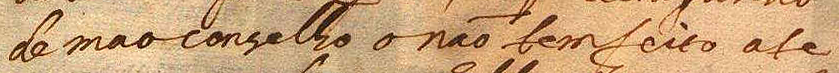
de mao conselho o não tem feito ate
